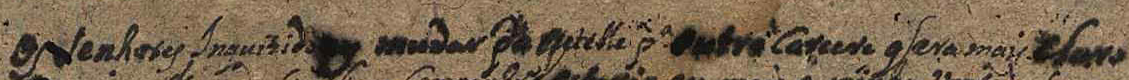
os Senhores Inquisido_s, mudar daquelle pa outro carcere q̄ era mais claro
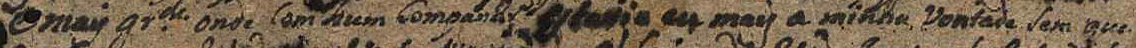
e mais gr.de onde Com hum Companhro estaria eu mais a minha vontade sem que
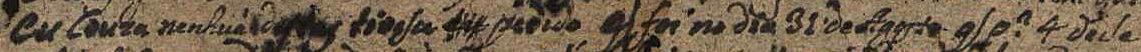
eu couza nenhuā destas tivesse que pedido, q̄ foi no dia 31. de Agosto q̄ p.a 4 de se
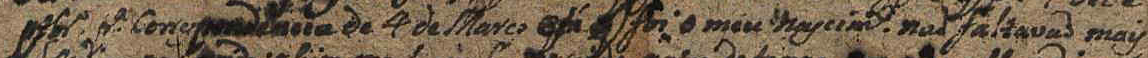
ptbr.o p.a correspondencia de 4 de Março está q̄ foi o meu nascim.to naõ faltavaõ mais
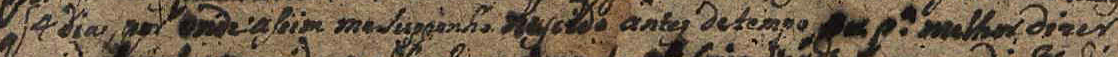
q̄ 4 dia, por onde assim me supponho nascido antes de tempo ou p.a melhor dizer
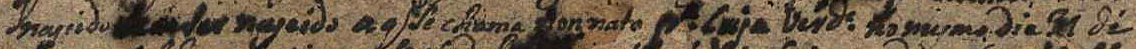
nascido ___ ser nascido a q̄ se chama Nonnato p.a Cuja verd.e no mesmo dia 31 di
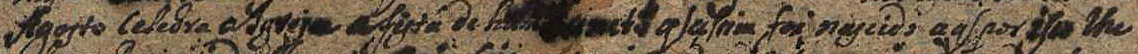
Agosto Celebra a Igreja a festa de hum__to q̄ assim foi nascido a q̄ por isso lhe
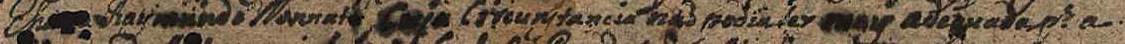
ch_ Raymundo Nonnato, Cuja Circunstancia naõ podia ser mais adequada p.a a
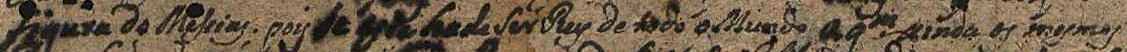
figura do Messias; pois se este ha de ser Rey de todo o Mundo a q.m ainda os mesmos
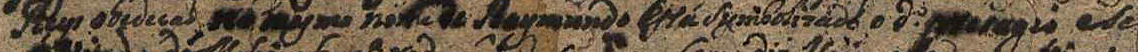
Reys obedeçaõ, no mesmo nome de Raymundo está symbolizado o d.o presagio, e se
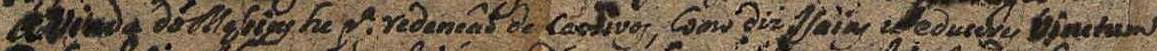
a vinda do Messias he p.a redençaõ de Captivos, como diz Isaias e seduceres Vjnctum
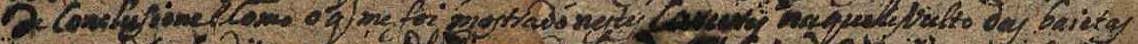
de Conclusione e Como o q̄ me foi mostrado nestes Carceres naquelle Vulto das baietas
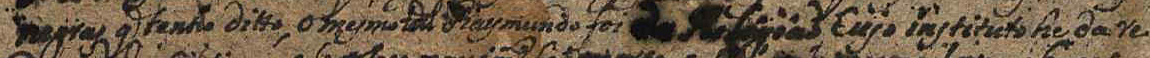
negras q̄ tenho ditto, o mesmo tal Raymundo foi da Religiaõ Cujo instituto he da re
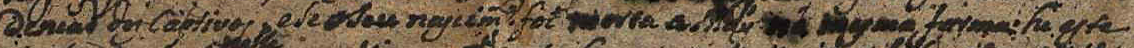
dençaõ dos Captivos, e se o seu nascim.to foi morta a May na mesma forma: he este
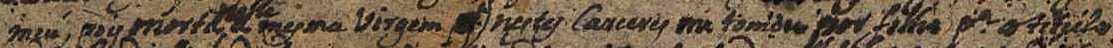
meu, pois morta nelle a mesma Virgem q̄ nestes Carceres me tomou por filho p.a o titulo
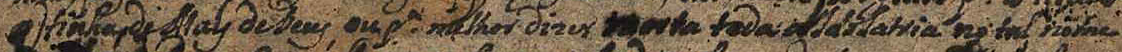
q̄ tinha de May de Deus, ou p.a melhor dizer morta toda a Idolatria no tal, nome
